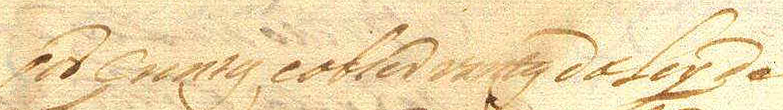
por crentes, e observantes da Ley de
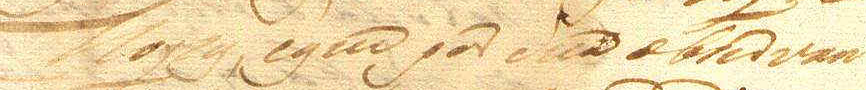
Moyzes, e que por sua observan
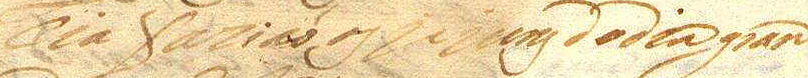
cia faziaõ os jejuns do dia gran
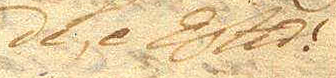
de, e Ester?
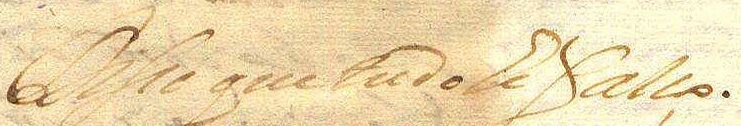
Disse que tudo he falço.
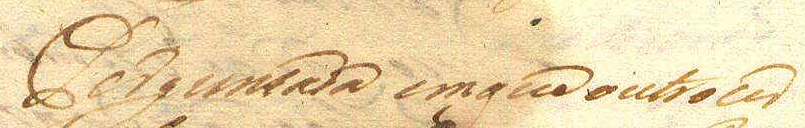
Perguntada em que outro cer
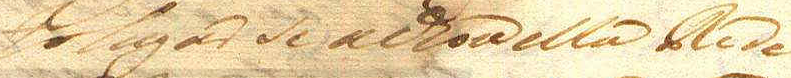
to lugar se achou ella Re de
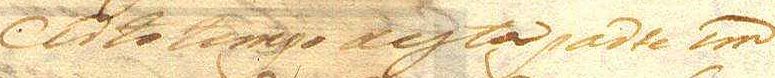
certo tempo a esta parte em
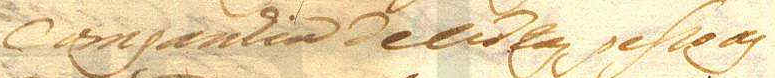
companhia de certas pessoas
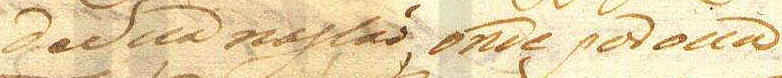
de sua nasçaõ, onde por occa
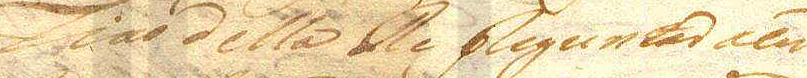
Ziaõ della Re preguntar a cer
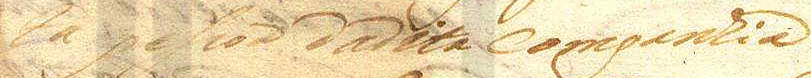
ta pessoa da dita companhia
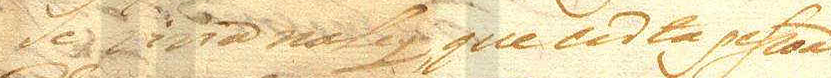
se vivia na Ley, que certa pessoa
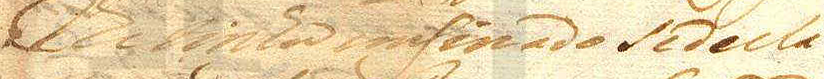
lhe tinha imsinado se decla
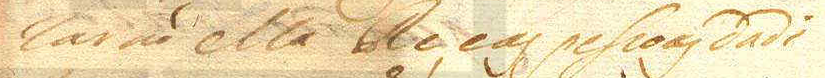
raraõ ella Re, e as pessoas da di
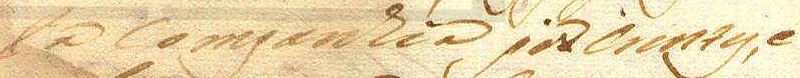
ta companhia por crentes, e
